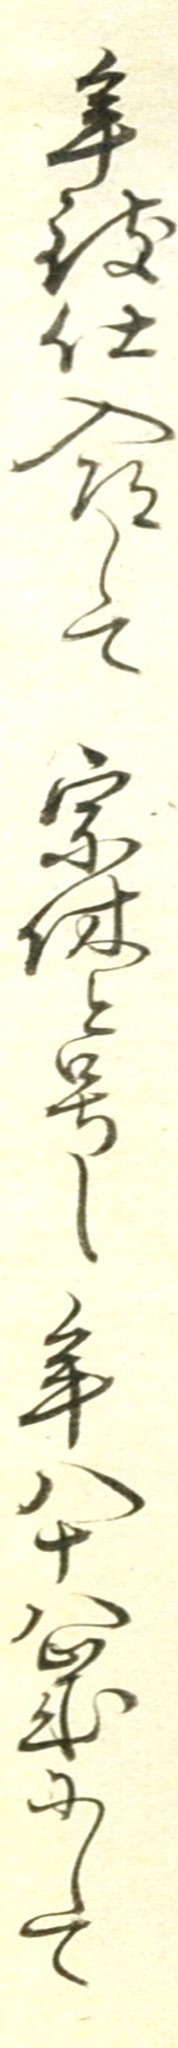年致仕入道して宗休と号し年八十八歳にして

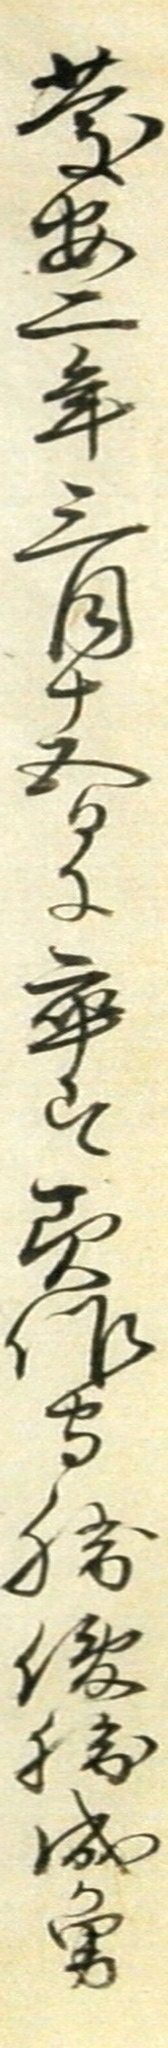慶安二年三月十五日に卒す美作守勝俊勝成か男
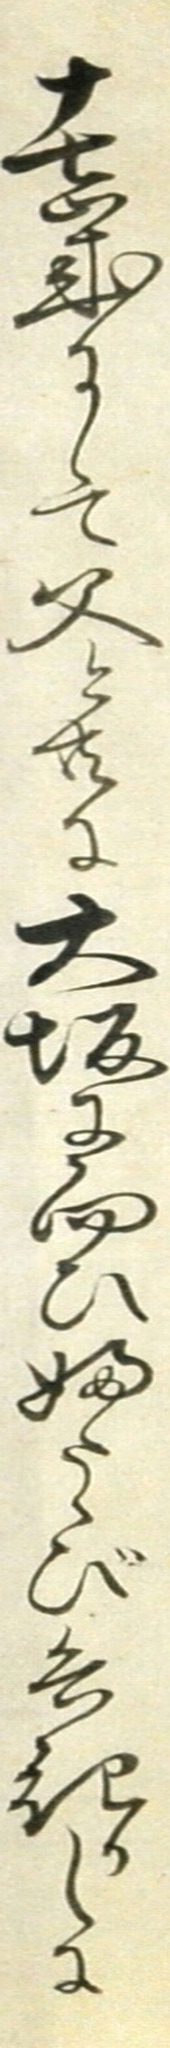十七歳にして父と共に大坂に向ひふたゝび兵起りしに
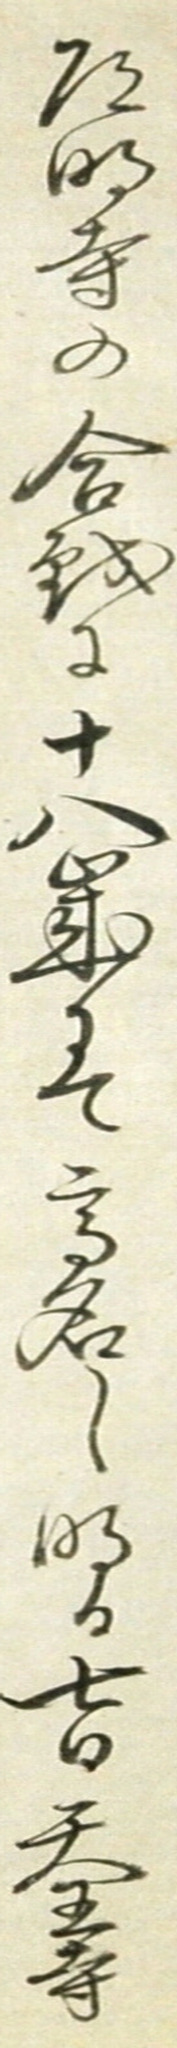道明寺の合戦に十八歳にて高名し明る七日天王寺
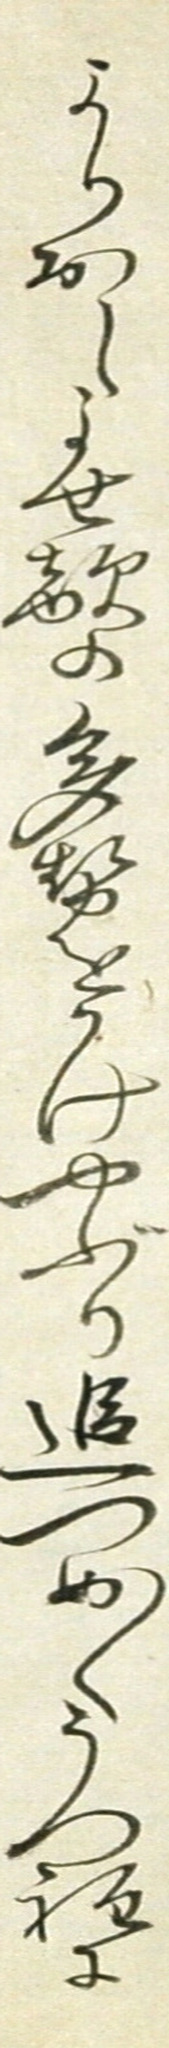よりおしよせ敵の多勢をかけやぶり追つめ〳〵うつ程に
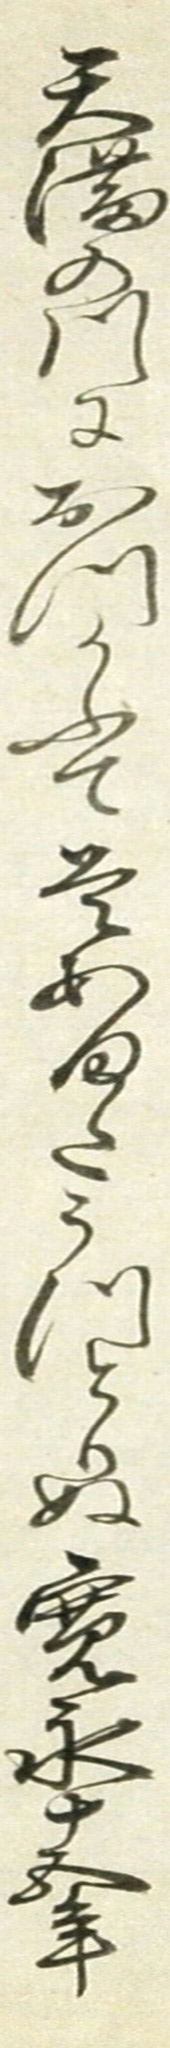天満の川におつかふて首あまたうつとりぬ寛永十五年
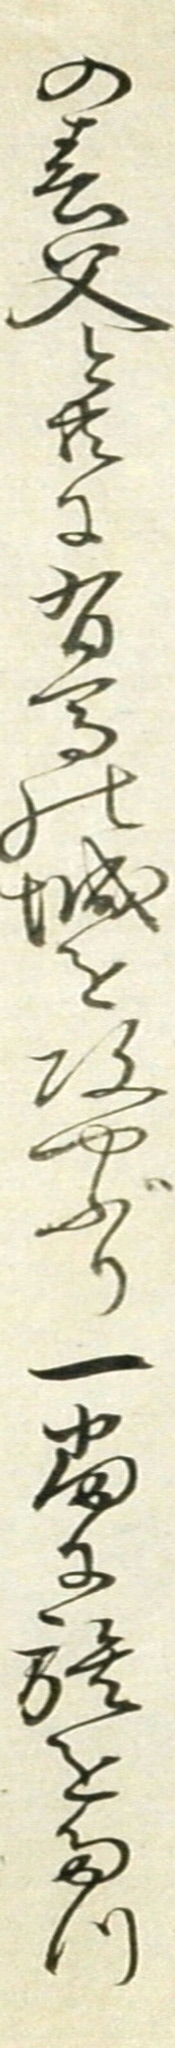の春父と共に有馬の城を攻やぶり一番に旗をたつ
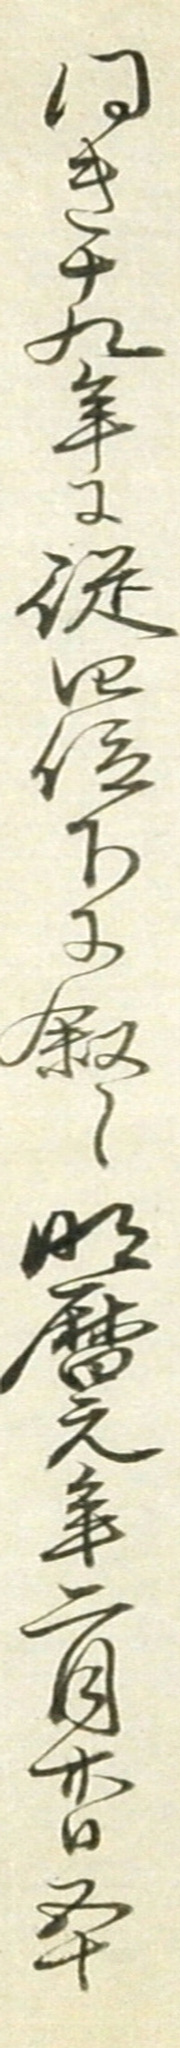同き十九年に従四位下に叙し明暦元年二月廿日五十
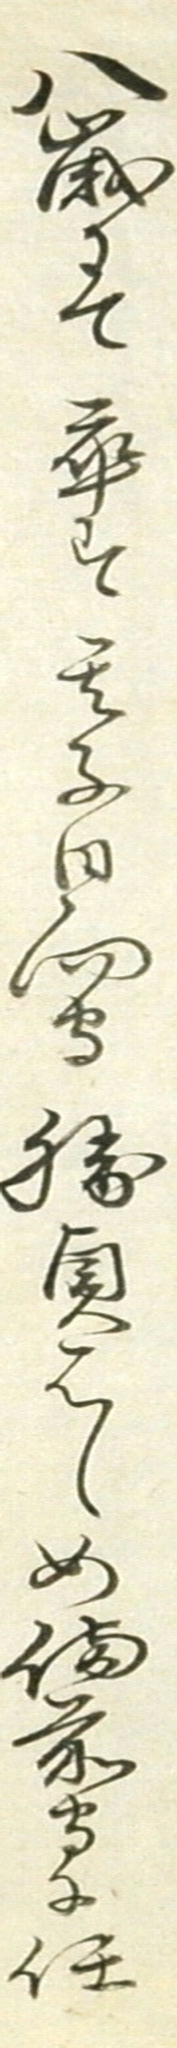八歳にて卒す其子日向守勝貞はしめ備前守に任
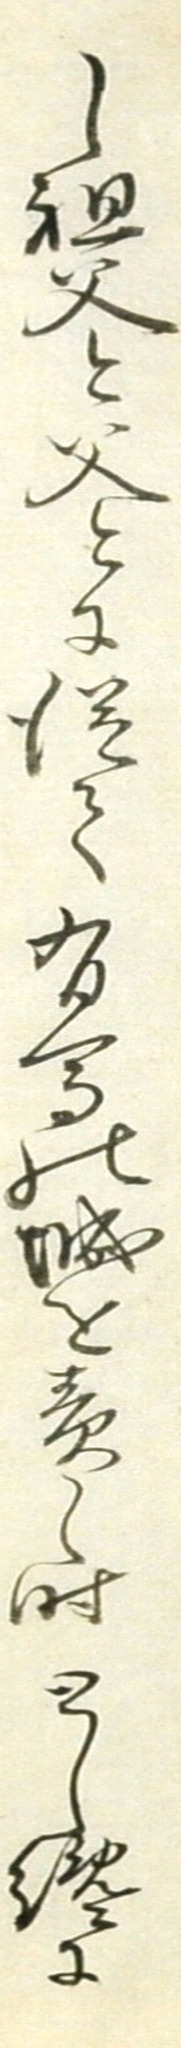し祖父と父とに従て有馬の城を責し時とし纔に
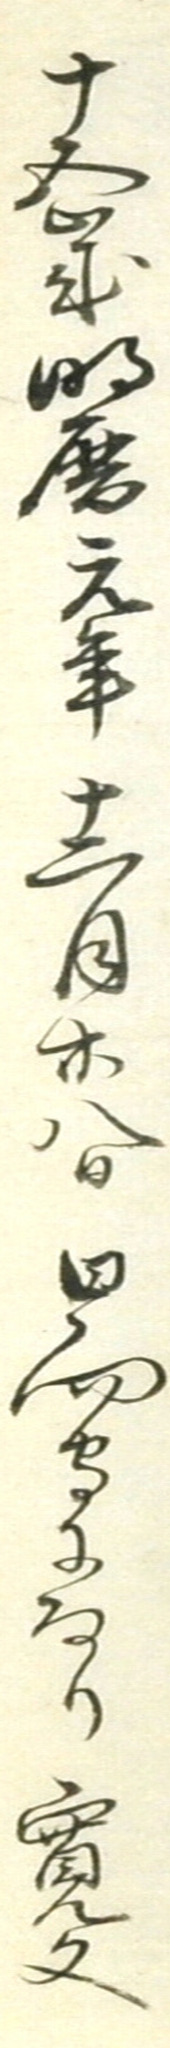十五歳明暦元年十二月廿八日日向守になり寛文
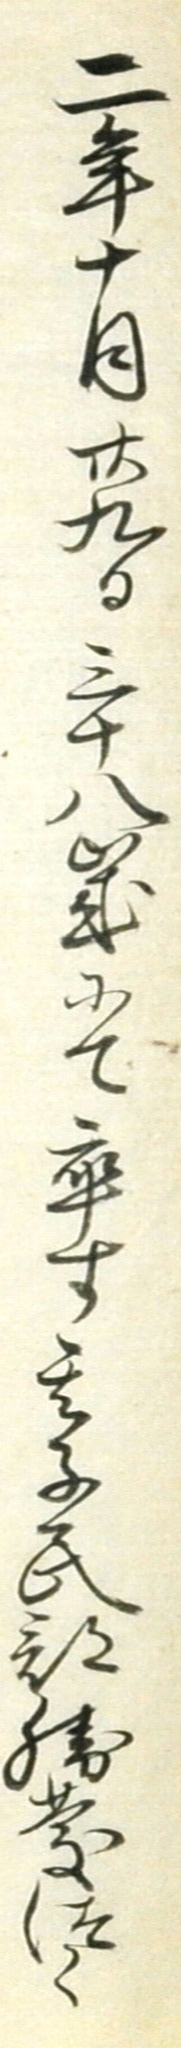二年十月廿九日三十八歳にて卒す其子民部勝慶つく
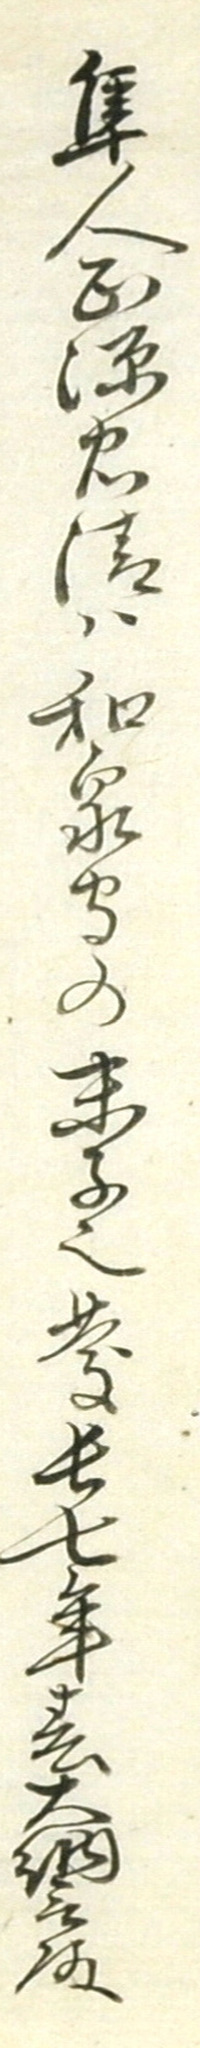隼人正源忠清は和泉守の末子也慶長七年春大納言殿
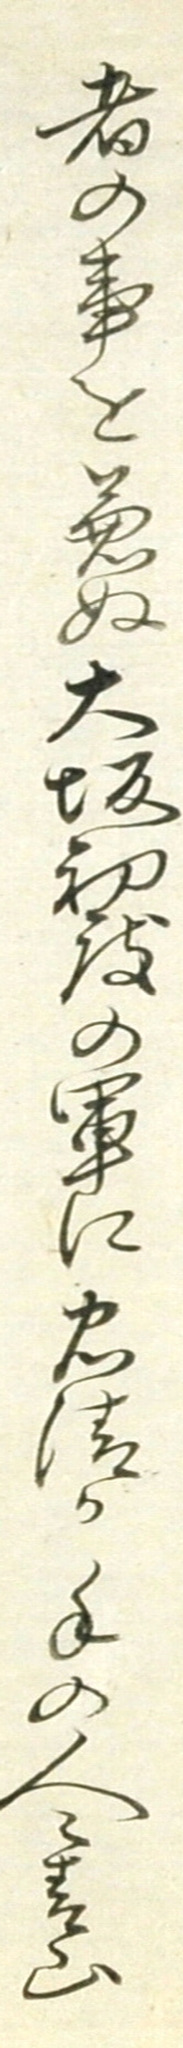者の事を兼ぬ大坂初度の軍に忠清か手の人々青山
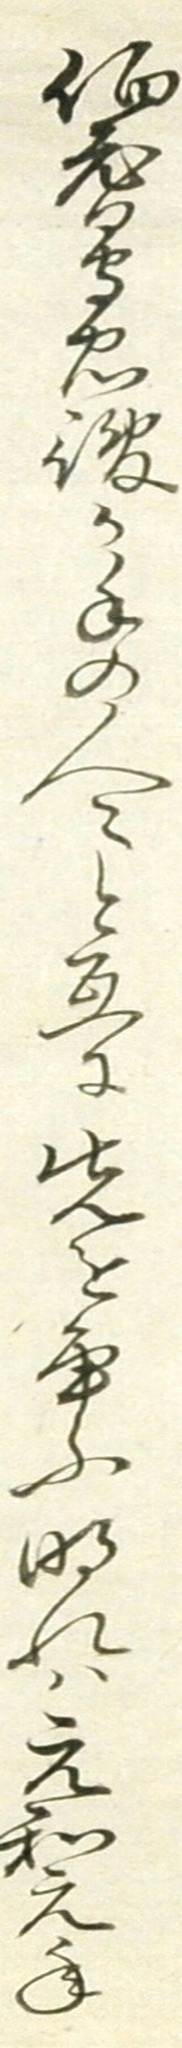伯耆守忠俊か手の人々と互に先を争ふ明れは元和元年
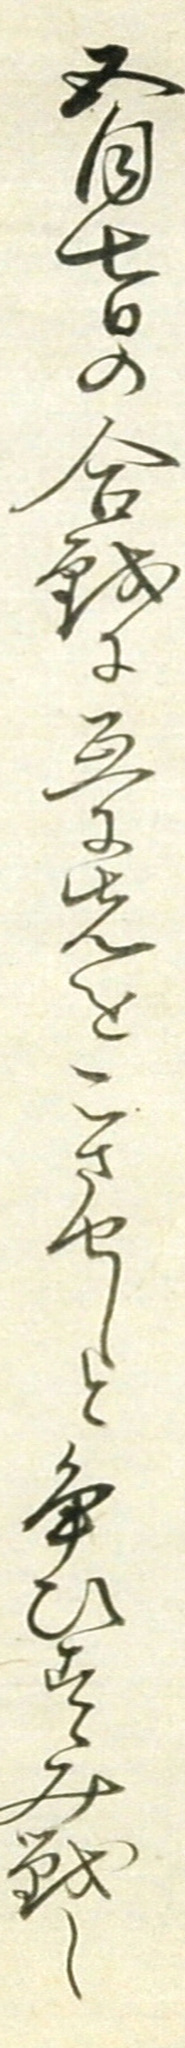五月七日の合戦に互に先をこさせしと争ひすゝみ戦し
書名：藩翰譜（二・三）
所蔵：伊那市立高遠町図書館・合同会社AMANE
